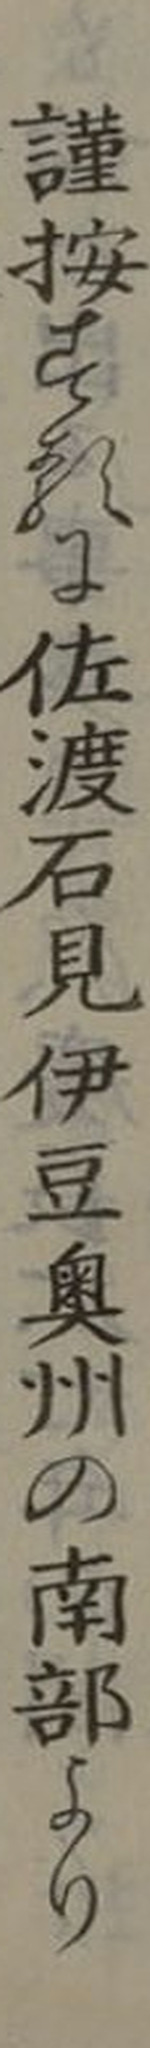謹按するに佐渡石見伊豆奧州の南部より
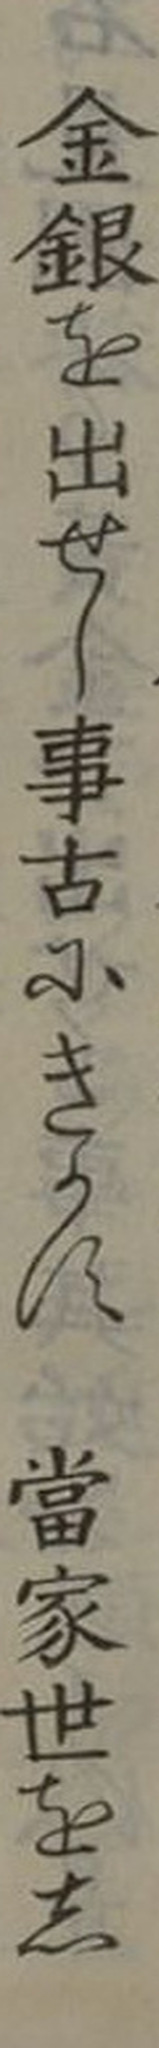金銀を出せし事古にきかす當家世をし
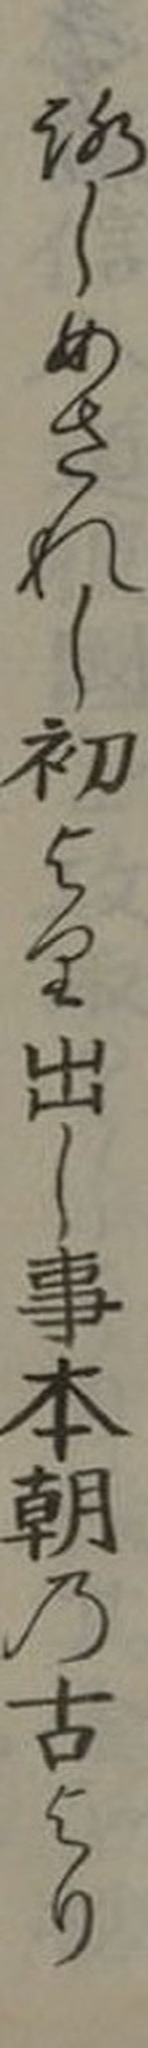ろしめされし初より出し事本朝の古より
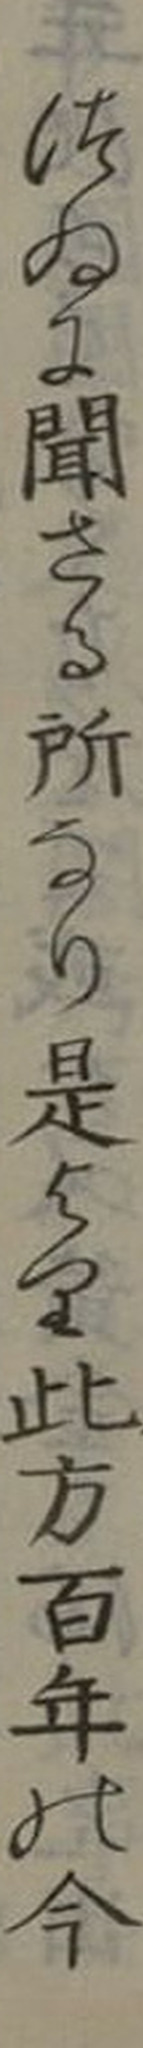つゐに聞さる所なり是より此方百年の今
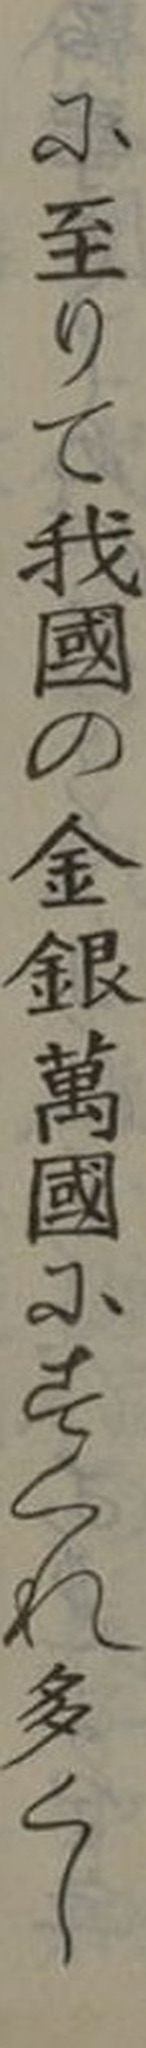に至りて我國の金銀萬國にすくれ多くし
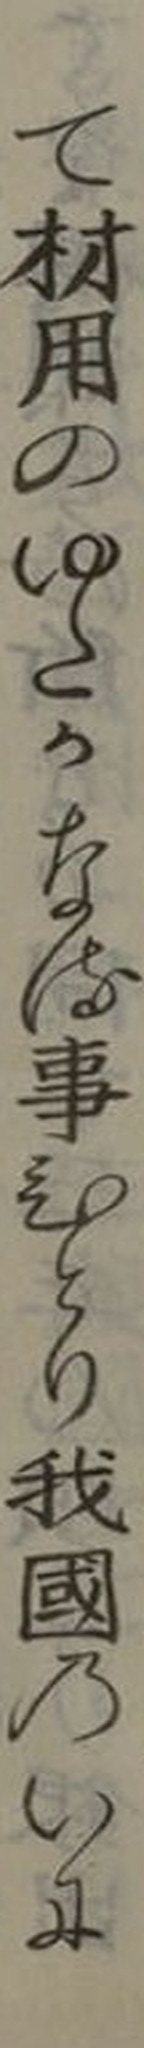て材用のゆたかなる事ひとり我國のいに
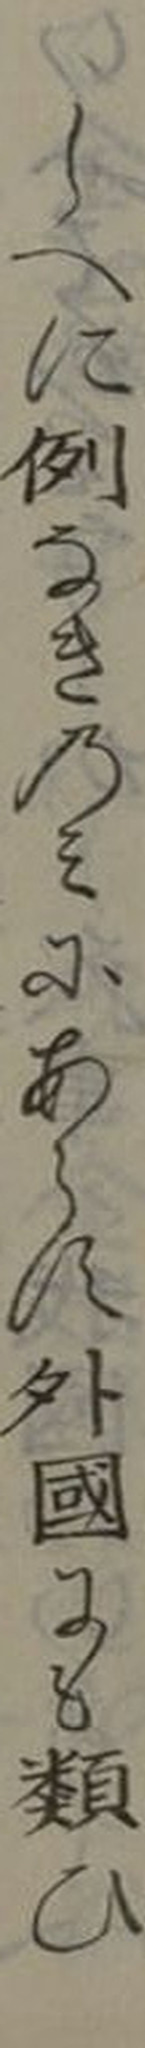しへに例なきのみにあらす外國にも類ひ
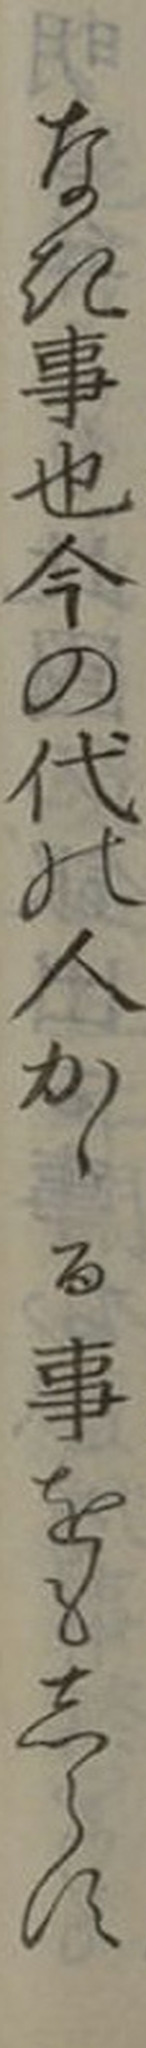なき事也今の代の人かゝる事をもしらす
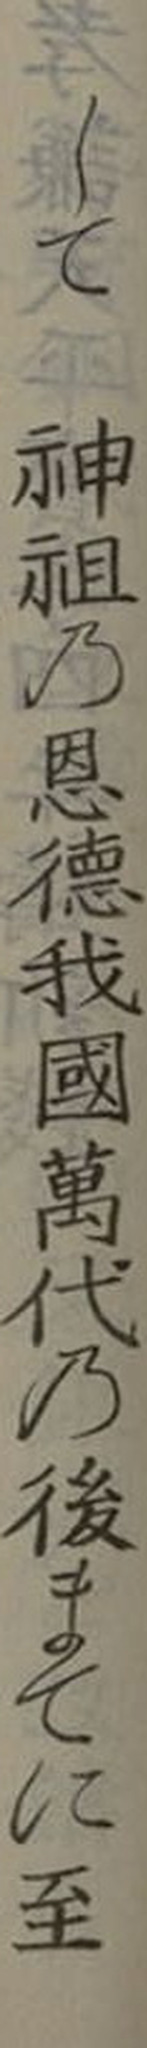して神祖の恩德我國萬代の後まてに至
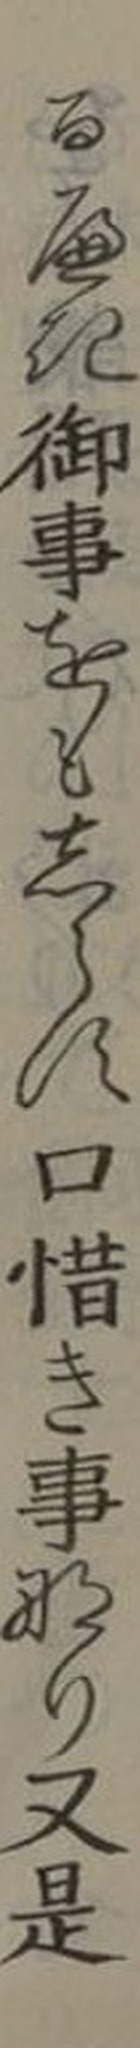るへき御事をもしらす口惜き事なり又是
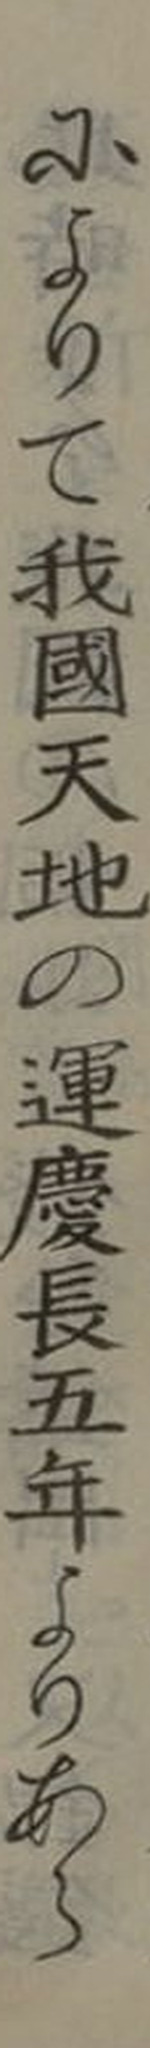によりて我國天地の運慶長五年よりあら
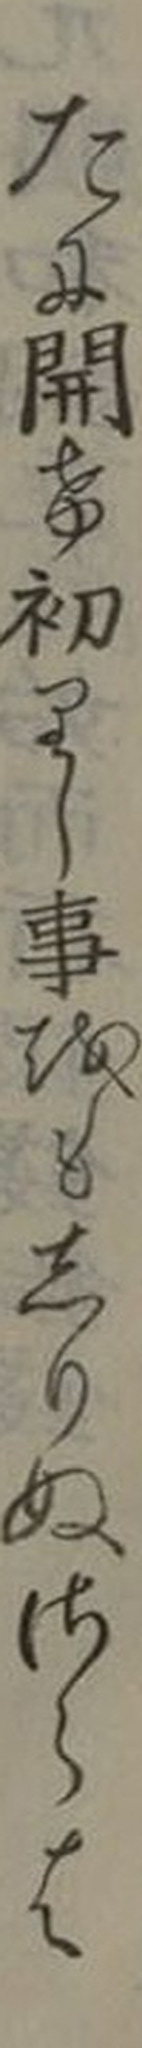たに開き初りし事をもしりぬさらは
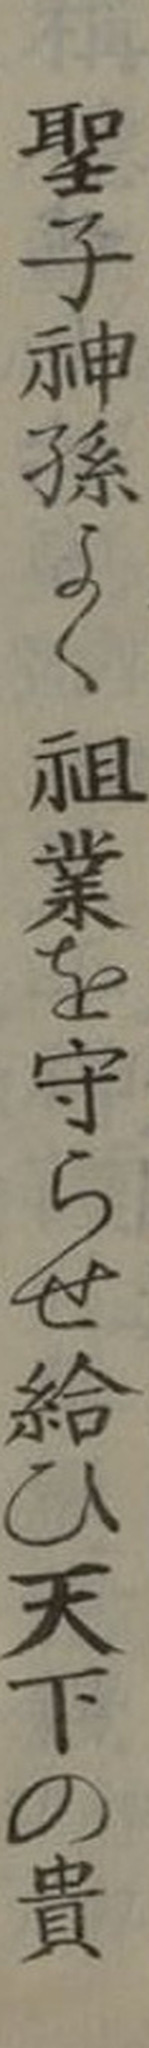聖子神孫よく祖業を守らせ給ひ天下の貴
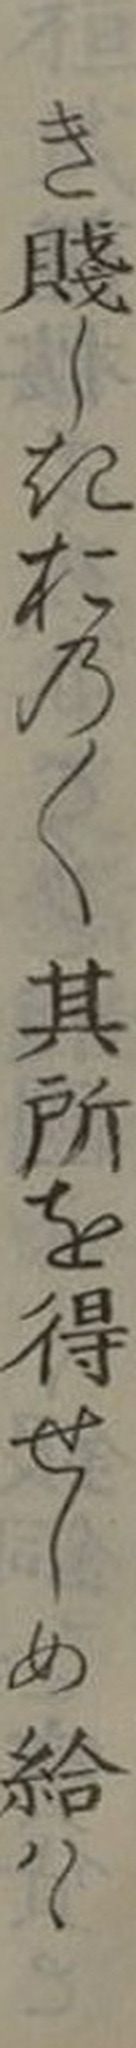き賤しきおの〳〵其所を得せしめ給はゝ
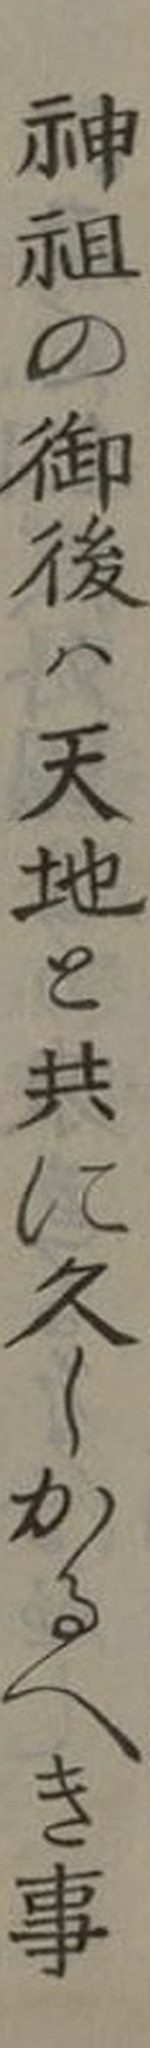神祖の御後は天地と共に久しかるへき事
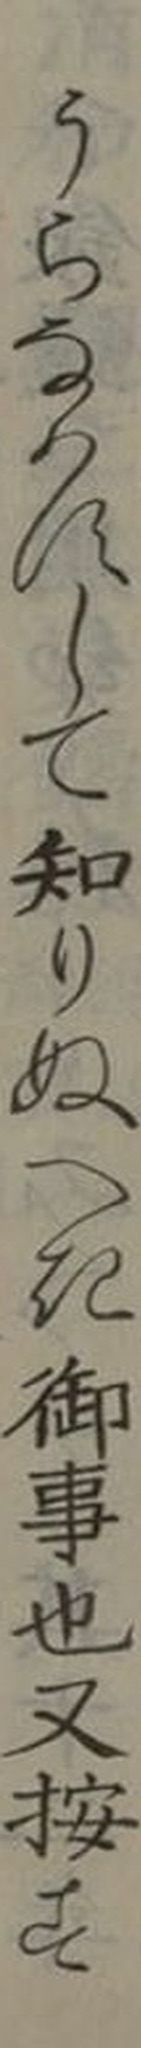うらなはすして知りぬへき御事也又按す
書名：骨董録
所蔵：University of the Ryukyus Library
